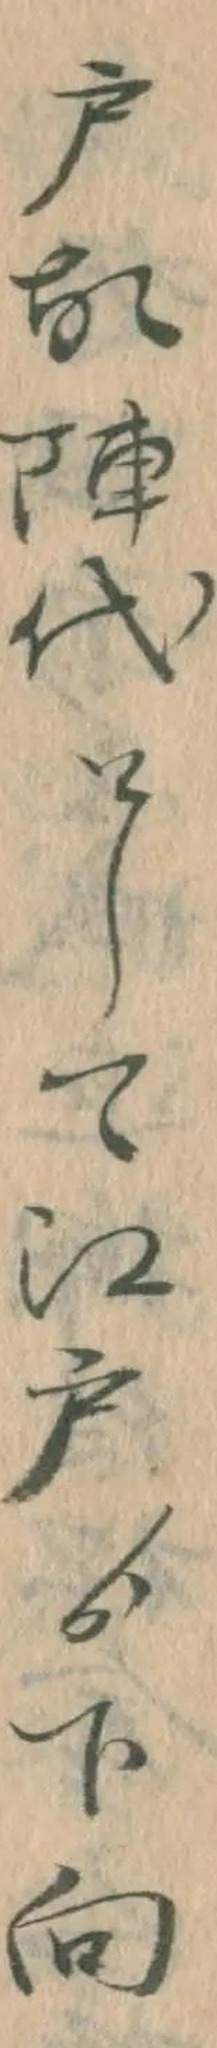戸故陣代として江戸ゟ下向
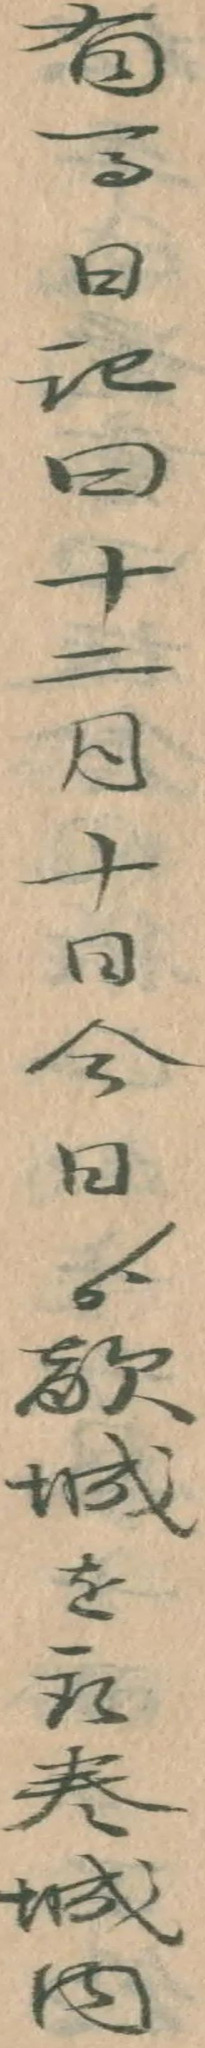有馬日記曰十二月十日今日ゟ敵城を取巻城内

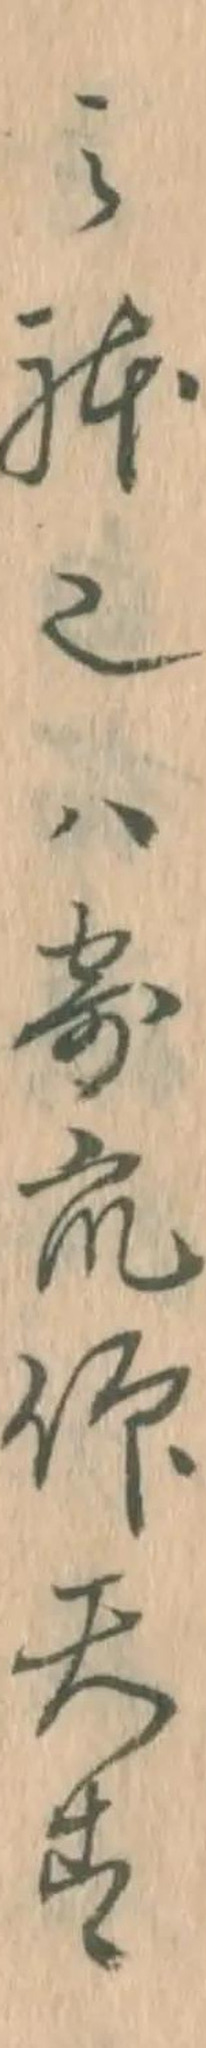之躰也は寄衆仰天春
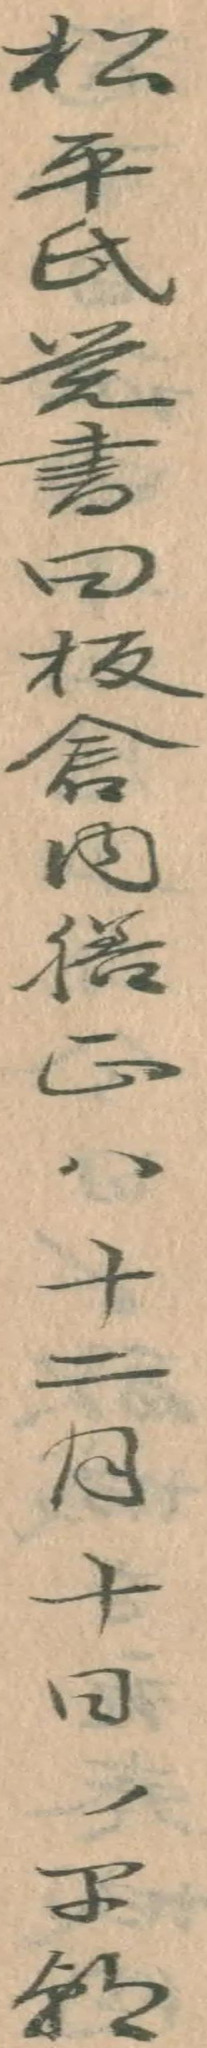松平氏覚書曰板倉内膳正は十二月十日之早朝
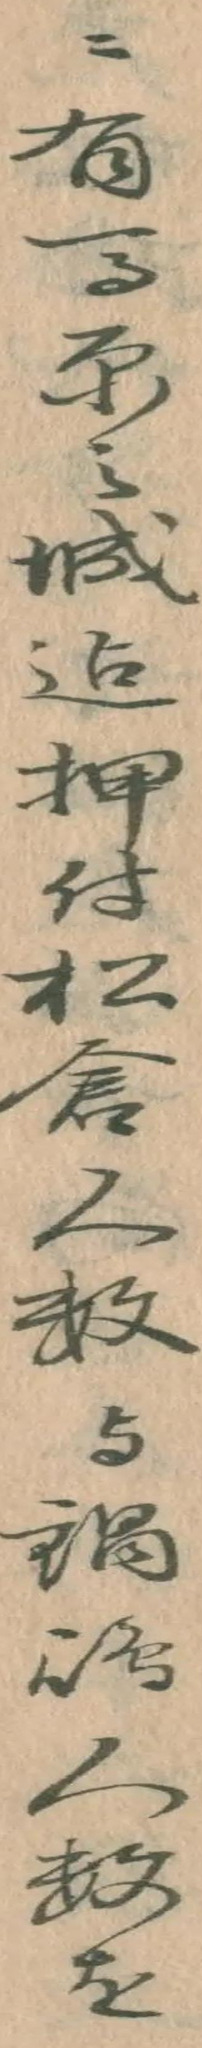に有馬原之城迄押付松倉人数与鍋島人数を
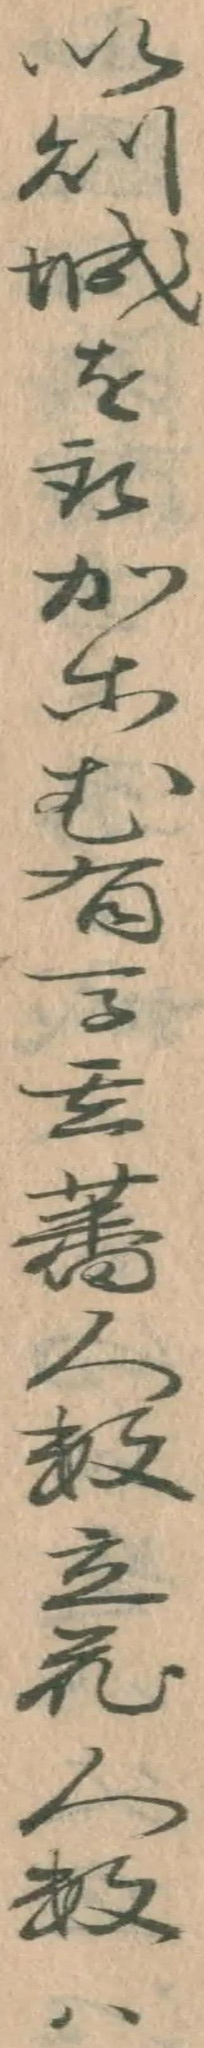以則城を取加古む有馬玄蕃人数立花人数は
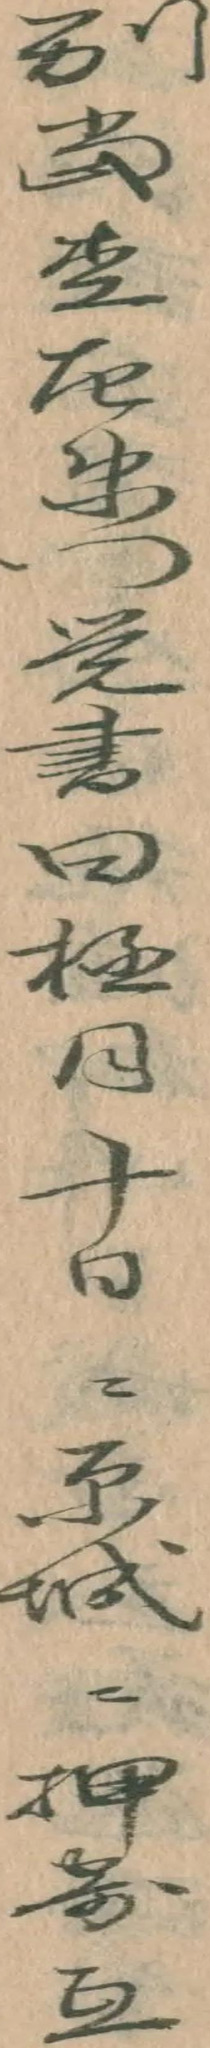別当杢左衛門覚書曰極月十日に原城に押寄互
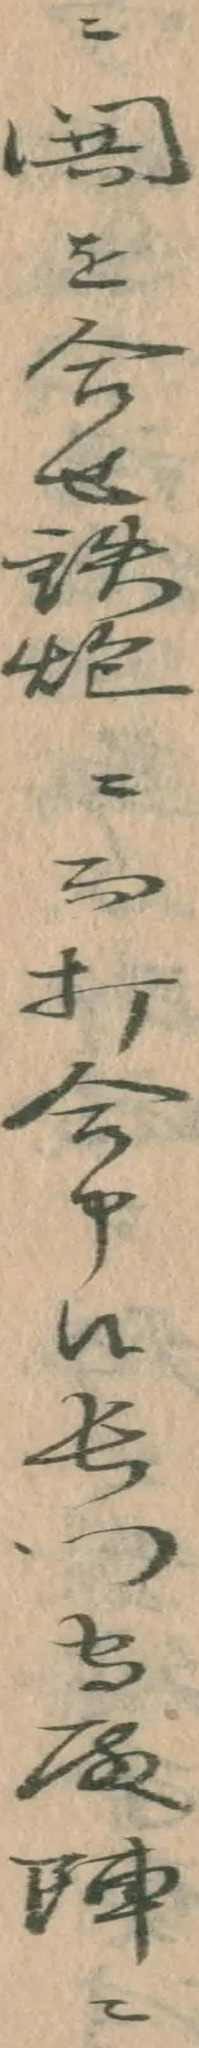に鬨を合せ鉄炮に而打合申候長門守殿陣に
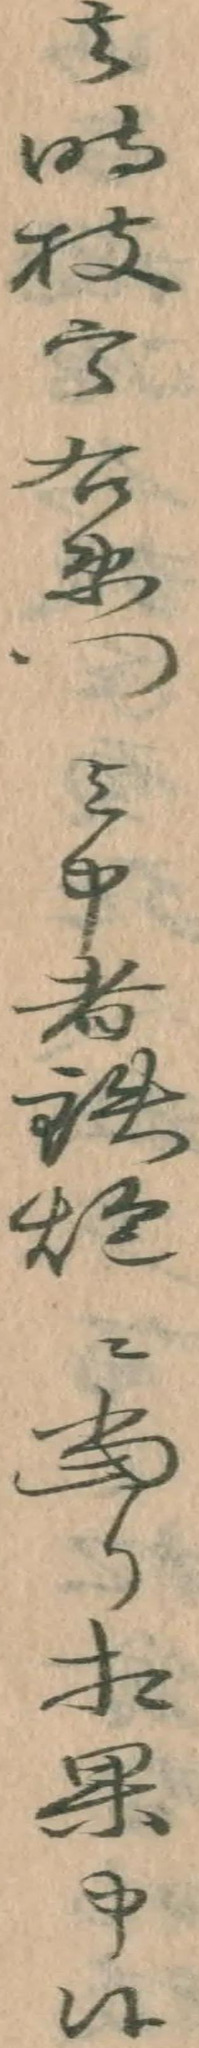者時枝宇右衛門与申者鉄炮に当り相果申候
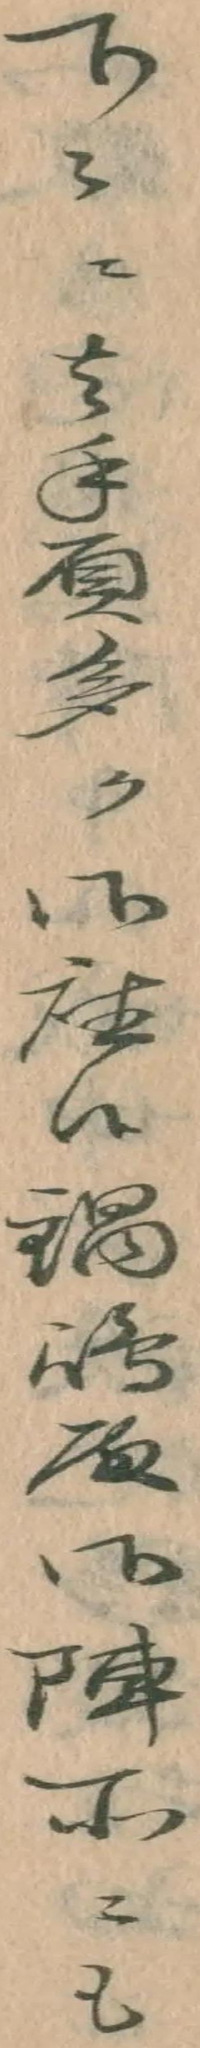下々に者手負多く御座候鍋島殿御陣所にも
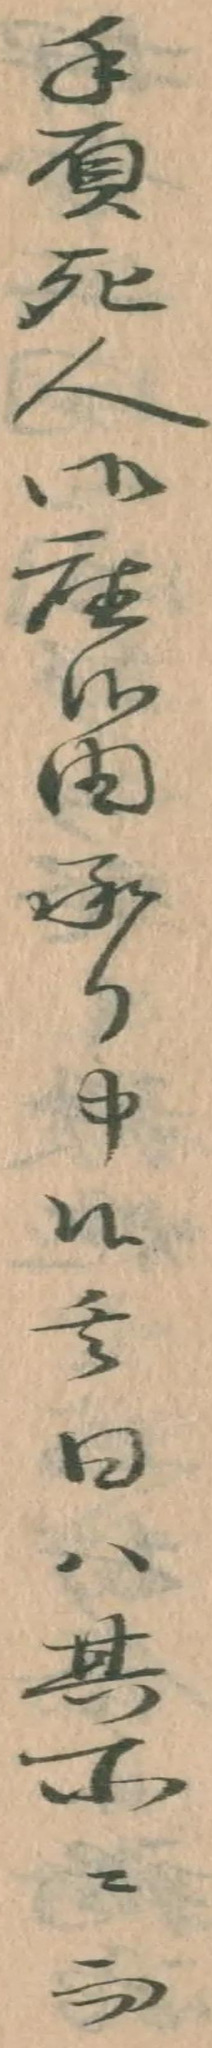手負死人御座候由承り申候其日は其所に而
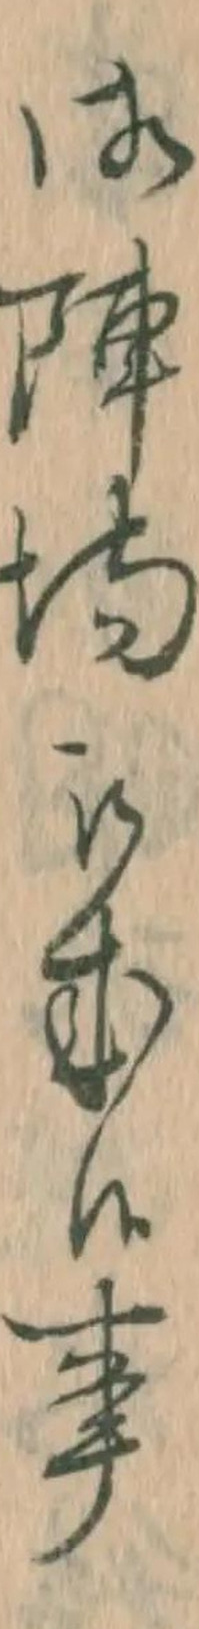御陣場被成候事
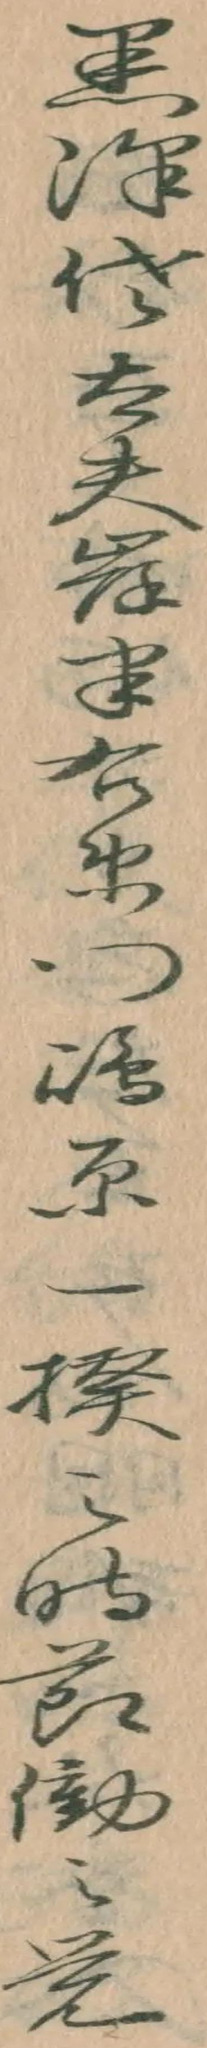黒沢佐太夫岸半右衛門島原一揆之時節働之覚
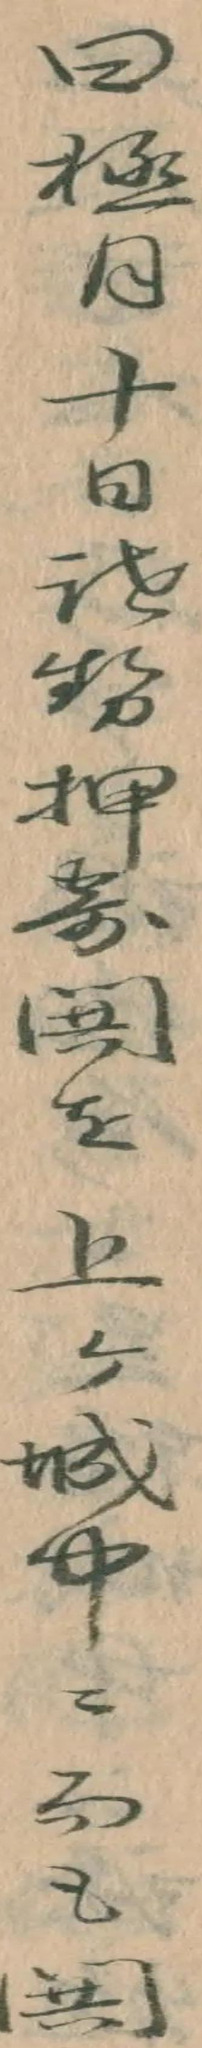曰極月十日諸勢押寄鬨を上け城中に而も鬨
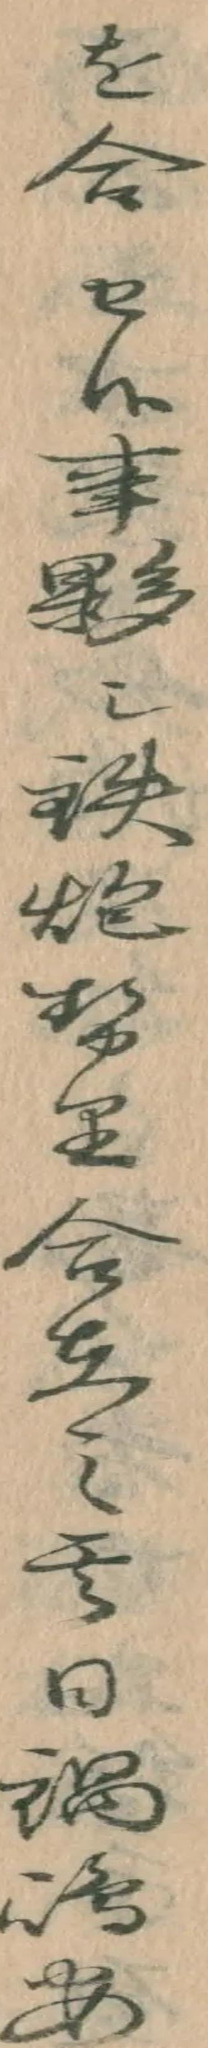を合せ候事夥し鉄炮勢里合在之其日鍋島安
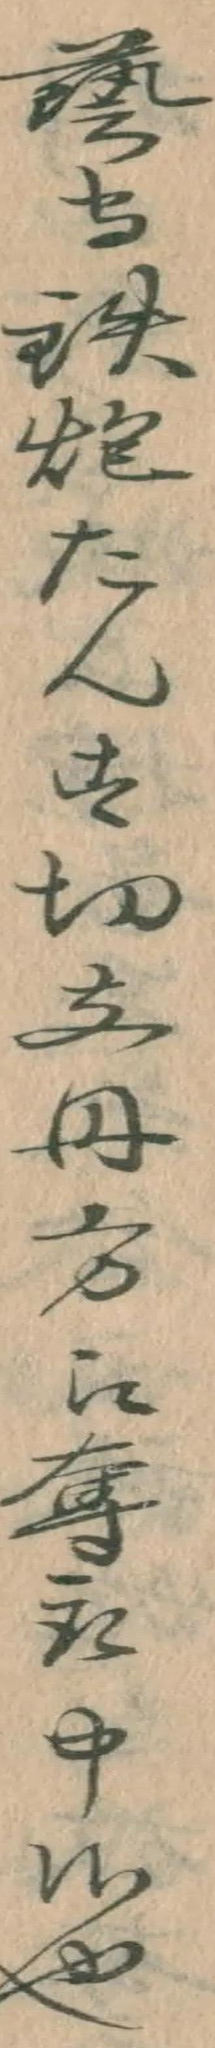芸守鉄炮たん春切支丹方江奪取申候也
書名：切支丹御退治記 49巻. [4]
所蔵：国立国会図書館 National Diet Library, JAPAN
